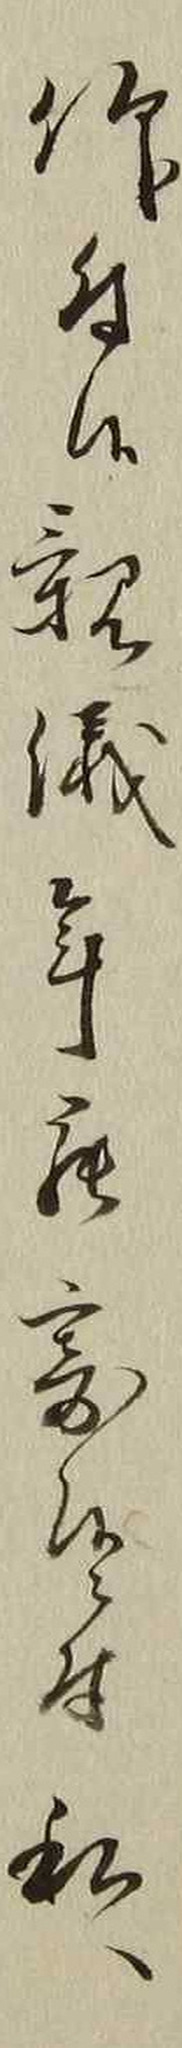仰付候親儀年罷寄候ニ付私へ
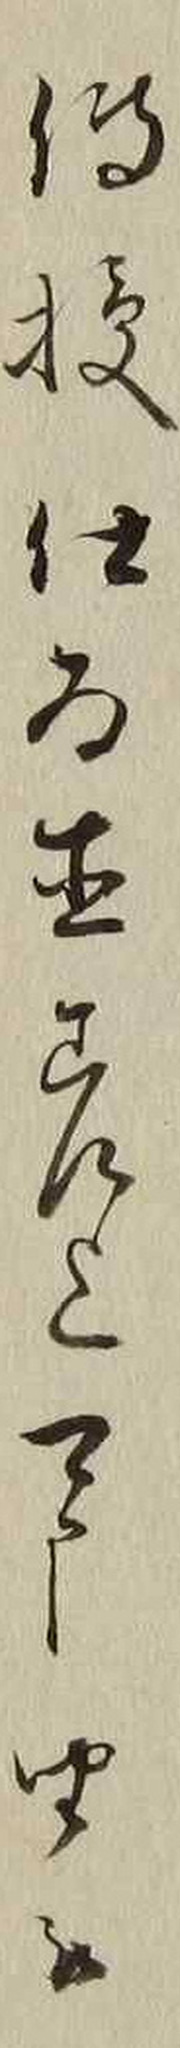伝授仕為直差上可申由被
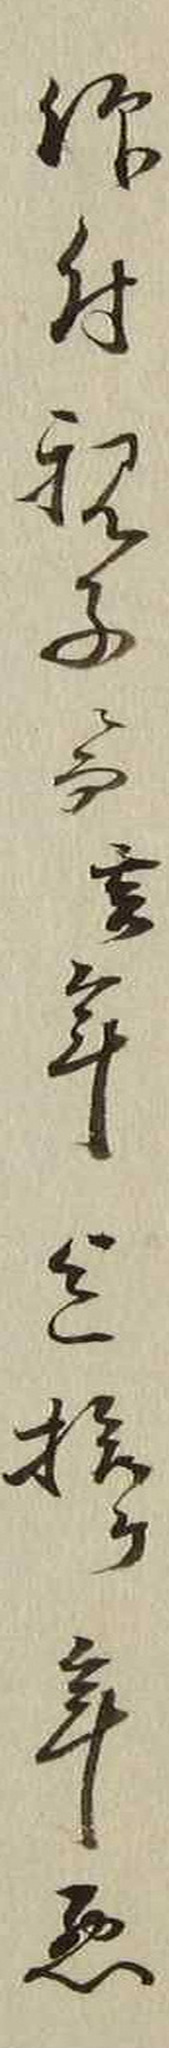仰付親子ニ而亥年迄拾ヶ年悪
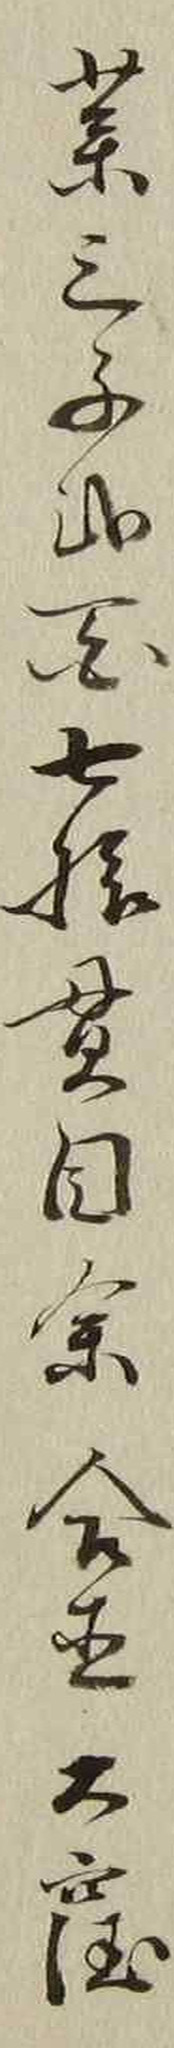薬三千弐百七拾貫目余合直大窪
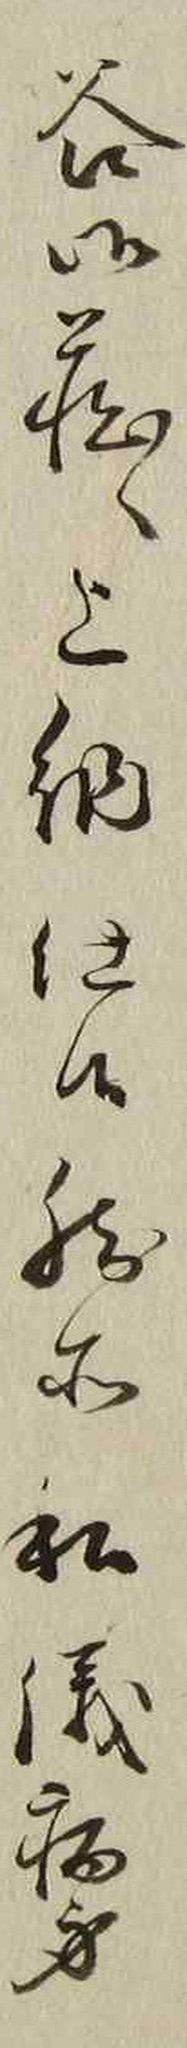谷御蔵へ上納仕候然所私儀病身
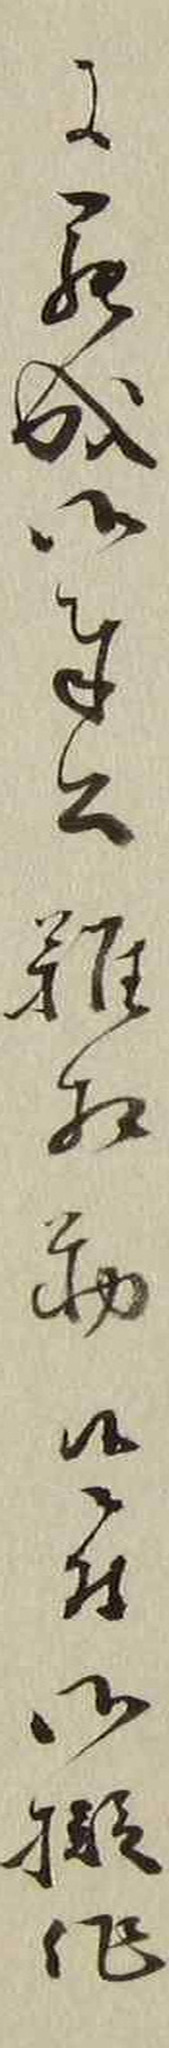に罷成御奉公難相勤候ニ付御擬作
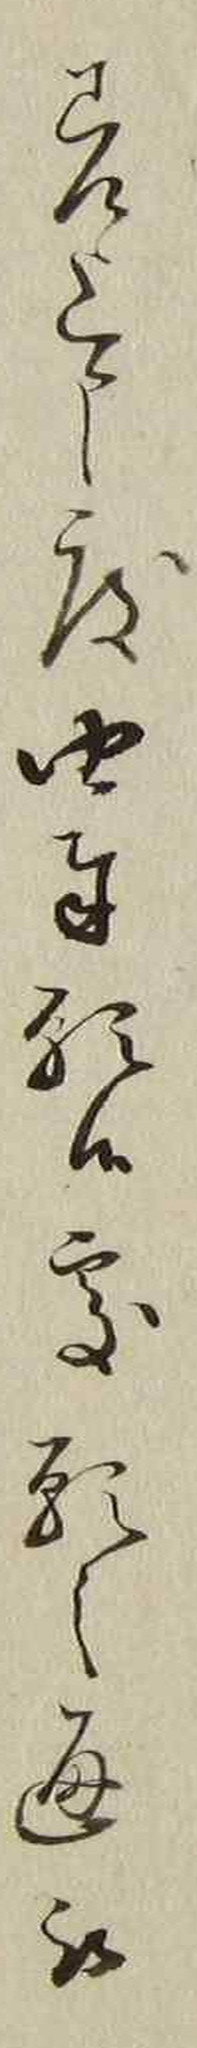差上申度由奉願候処願之通被
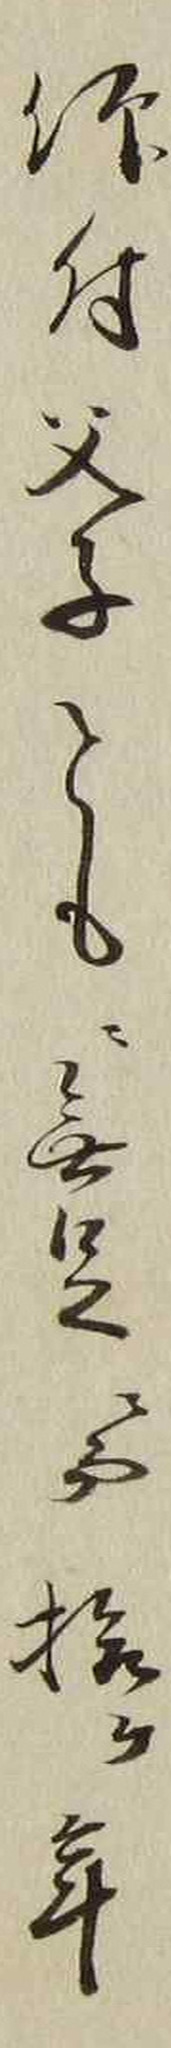仰付父子ともニ無足ニ而拾ヶ年
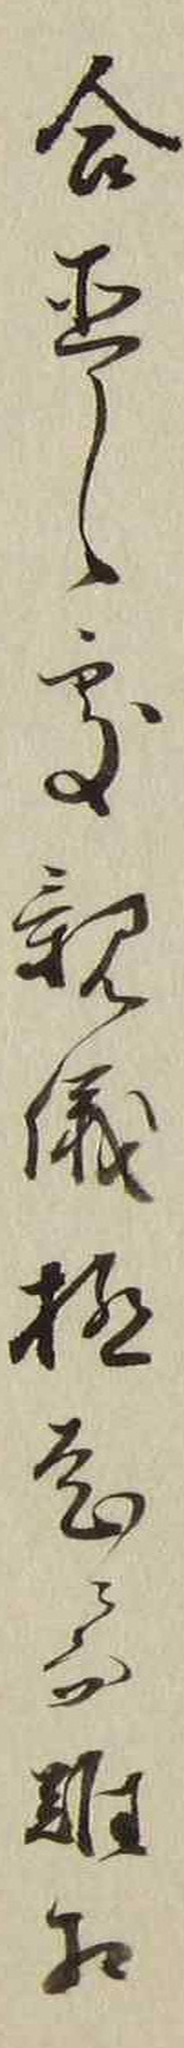合直し候処親儀極老ニ而難相
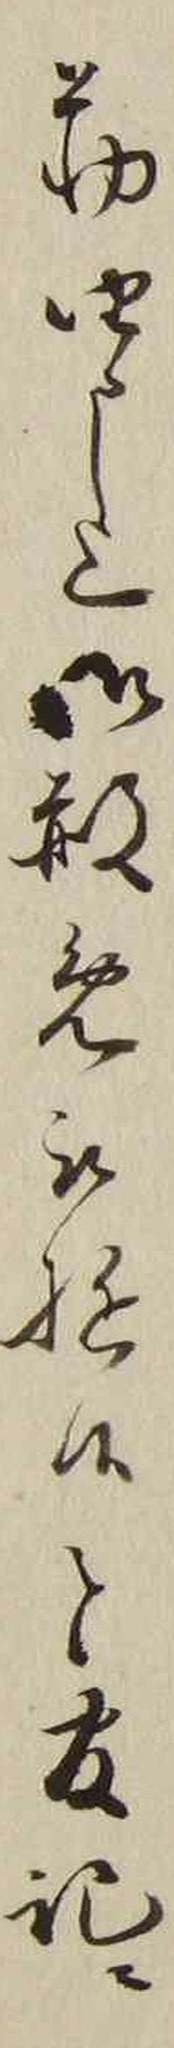勤由申上御赦免被遊候と官記ニ

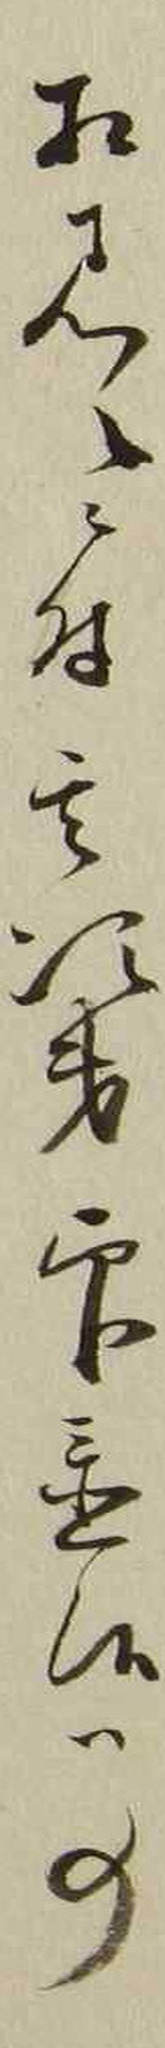相見候ニ付其次第印置候事
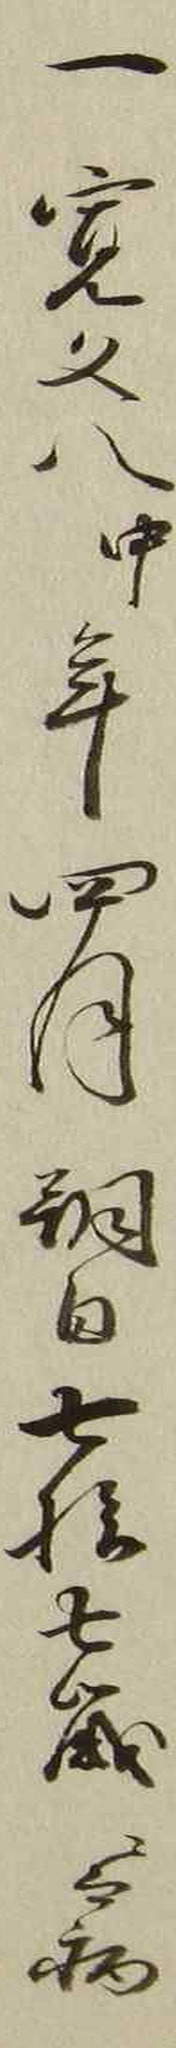一寛文八申年四月朔日七拾七歳ニ而病
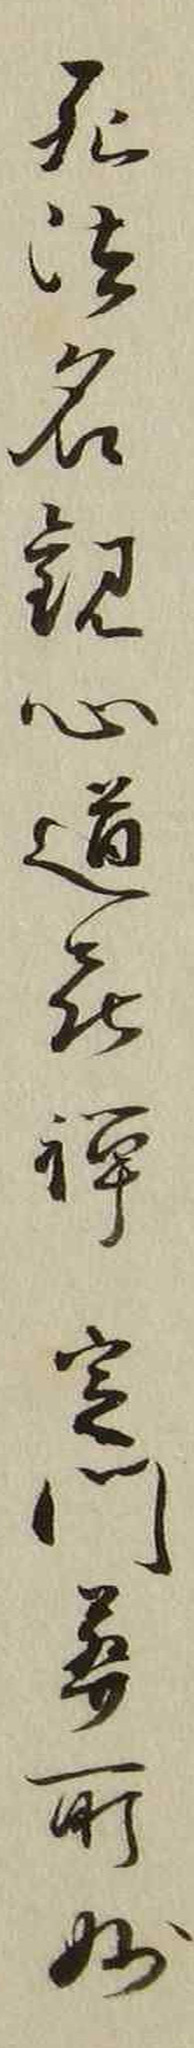死法名観心道喜禅定門葬所妙
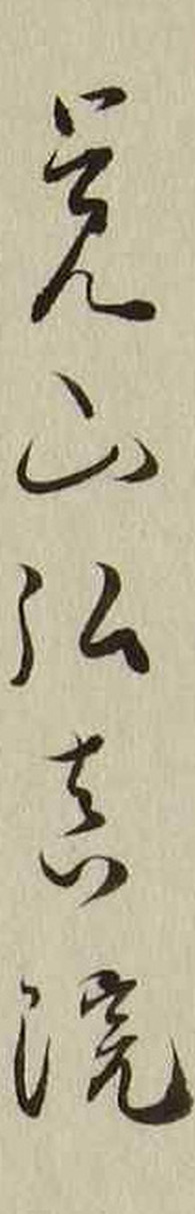覚山弘真院
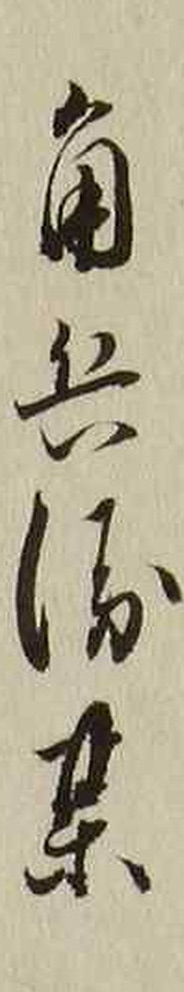角兵衛某
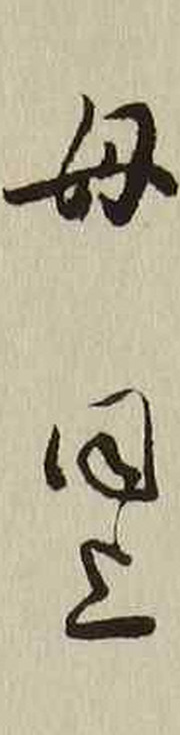母同上
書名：諸士系譜　巻之52　に之部3
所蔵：会津若松市立会津図書館
